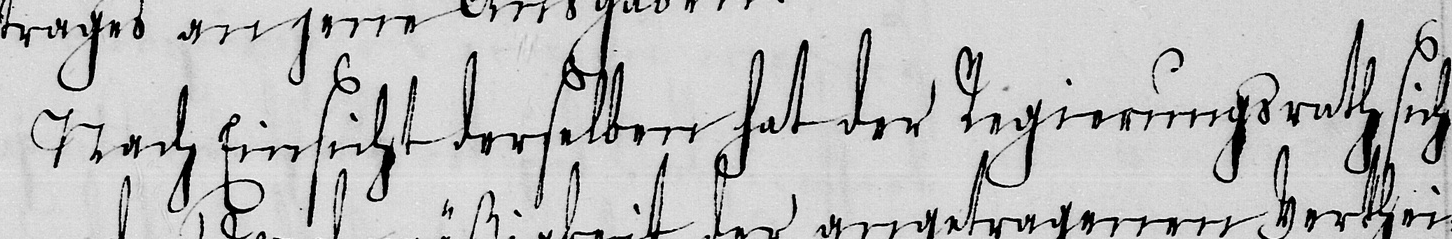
Nach Einsicht derselben hat der Regierungsrath si¬
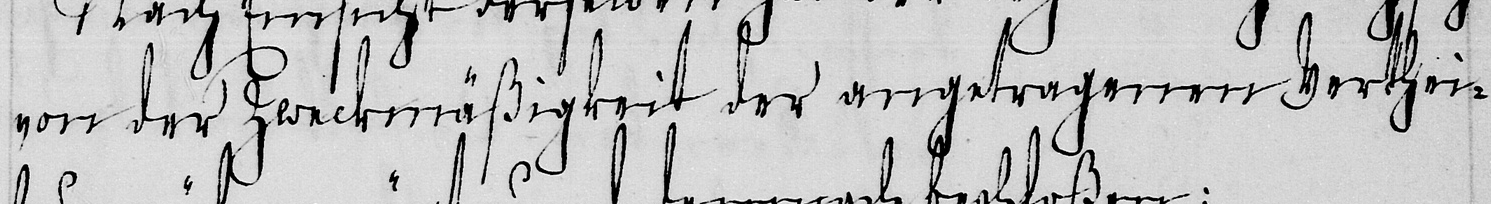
von der Zweckmäßigkeit der angetragenen Verthei¬
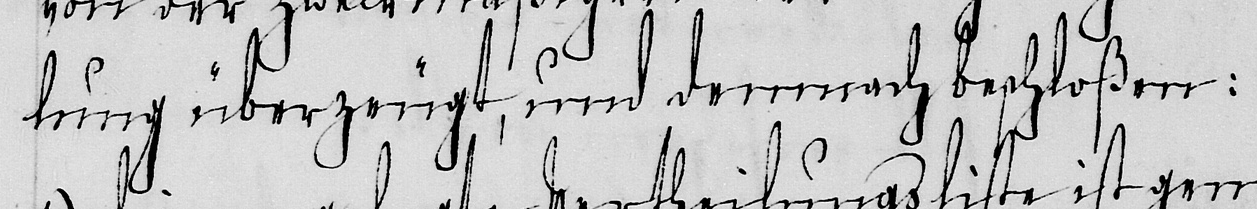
lung überzeugt, und demnach beschloßen:
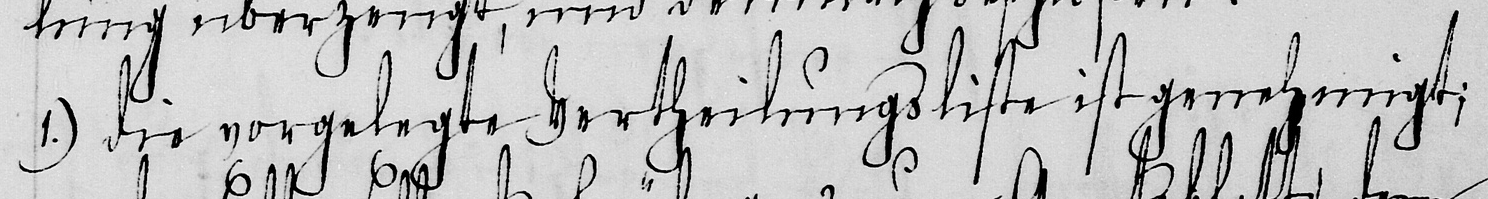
1.) die vorgelegte Vertheilungsliste ist genehmigt;
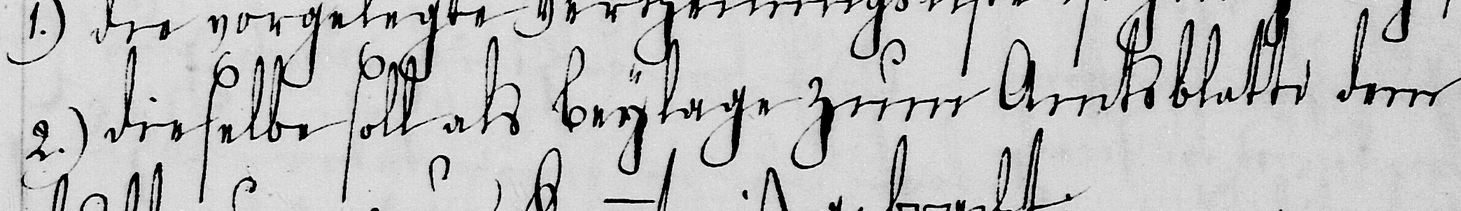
2.) dieselbe soll als Beylage zum Amtsblatte dem
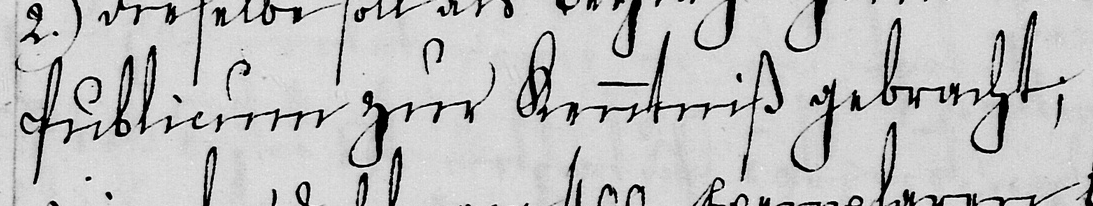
Publicum zur Kenntniß gebracht;
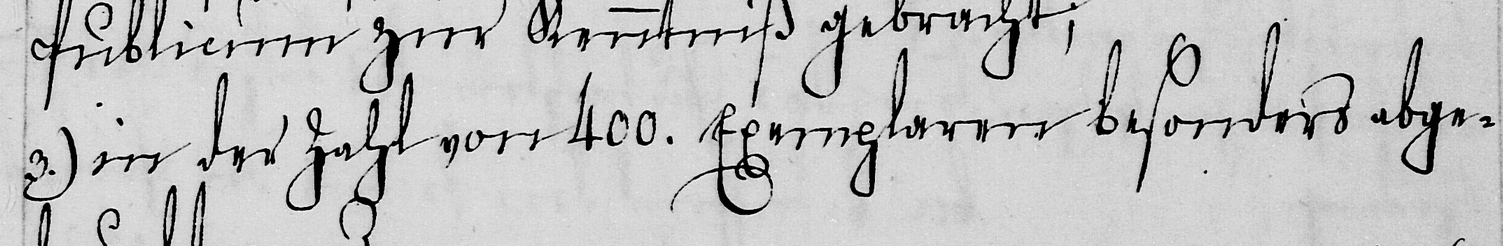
3.) in der Zahl von 400. Exemplaren besonders abge¬
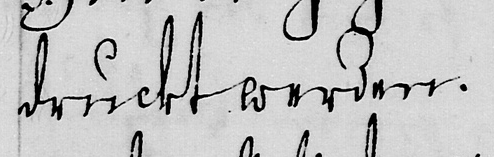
druckt werden.
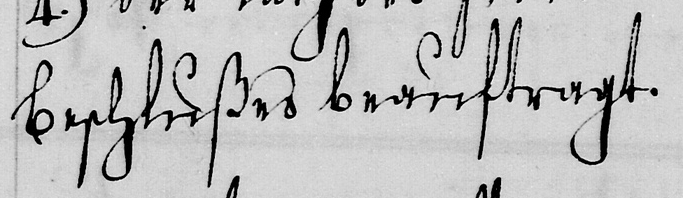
Beschlußes beauftragt.
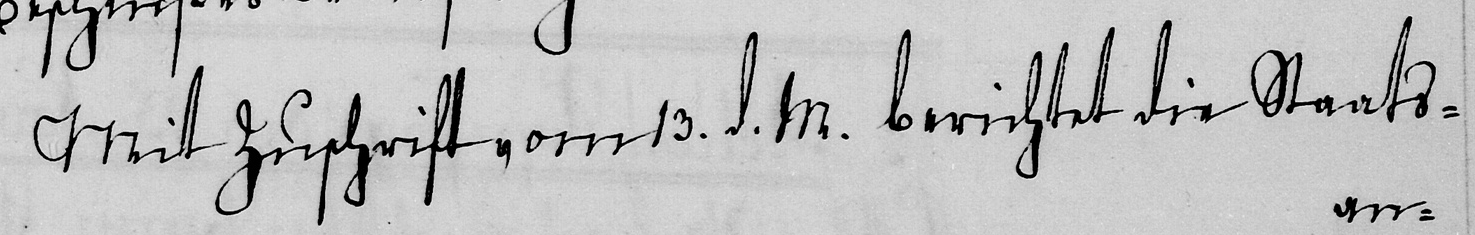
Mit Zuschrift vom 13. d. M. berichtet die Staats-
